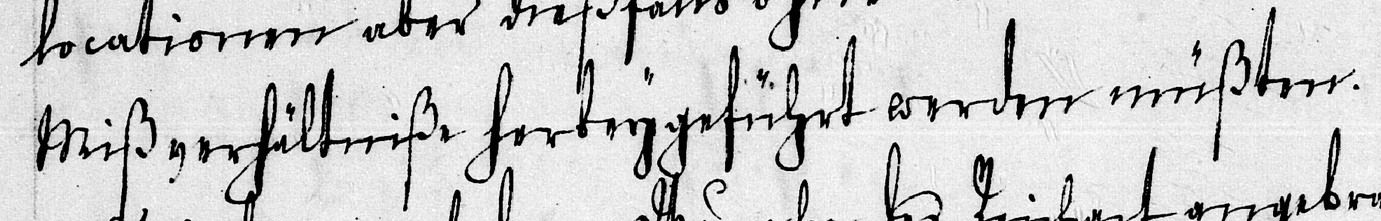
Mißverhältniße herbeygeführt werden müßten.
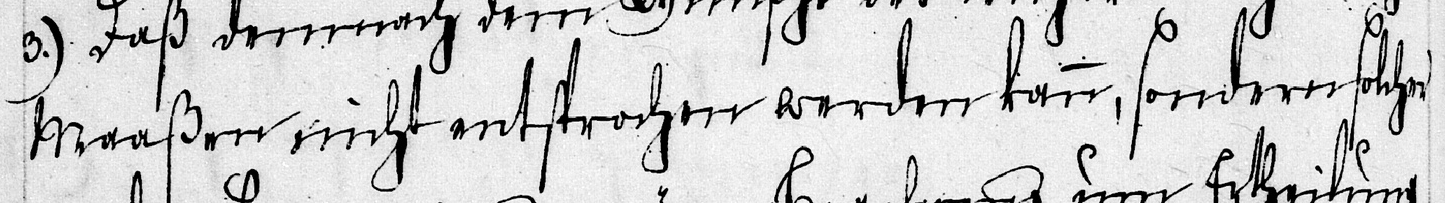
Maaßen nicht entsprochen werden kann, sondern solch¬
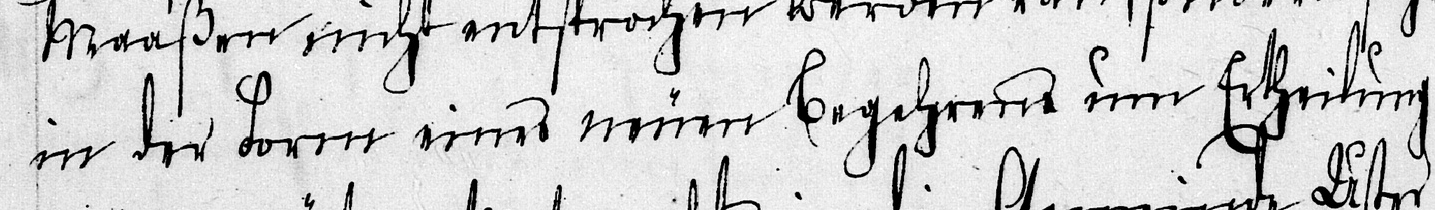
in der Form eines neuen Begehrens um Ertheilung
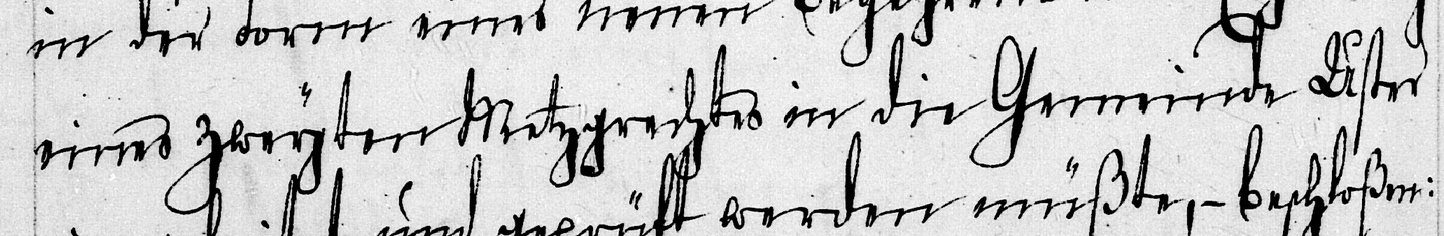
eines zweyten Metzgrechtes in die Gemeinde Uster
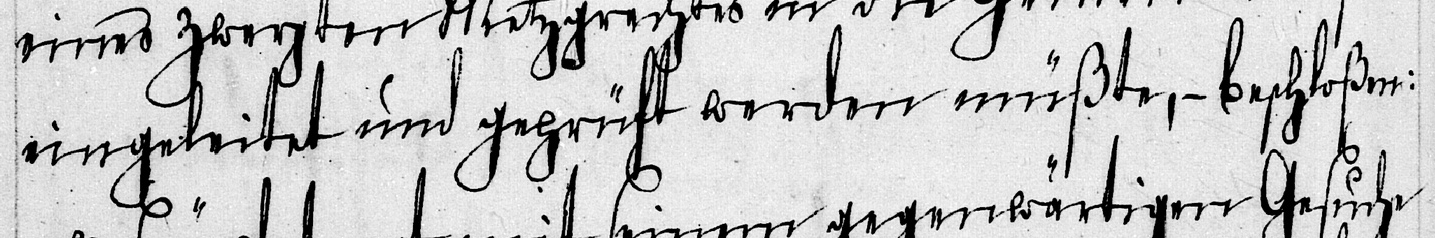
eingeleitet und geprüft werden müßte, – beschloßen:
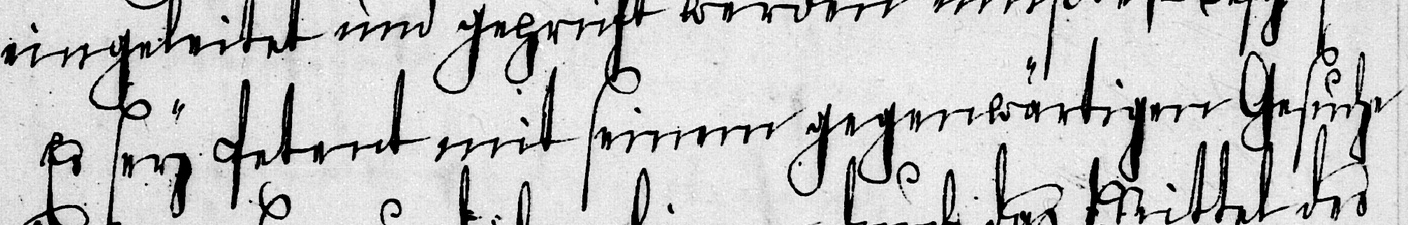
Es sey Petent mit seinem gegenwärtigen Gesuche
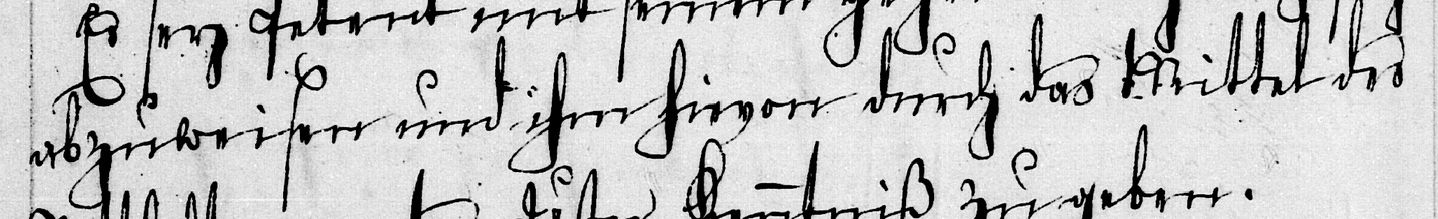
abzuweisen und ihm hievon durch das Mittel des
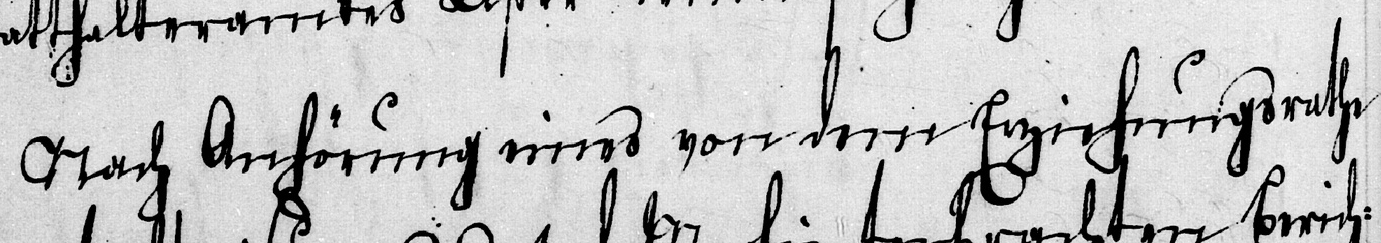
Nach Anhörung eines von dem Erziehungsrathe
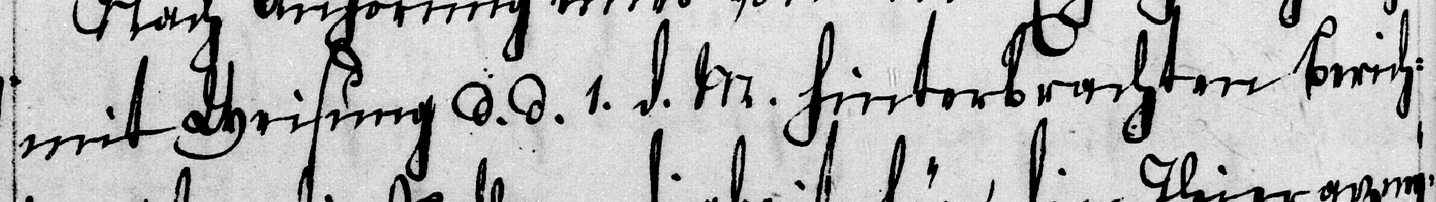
mit Weisung d. d. 1. d. M. hinterbrachten Beric¬
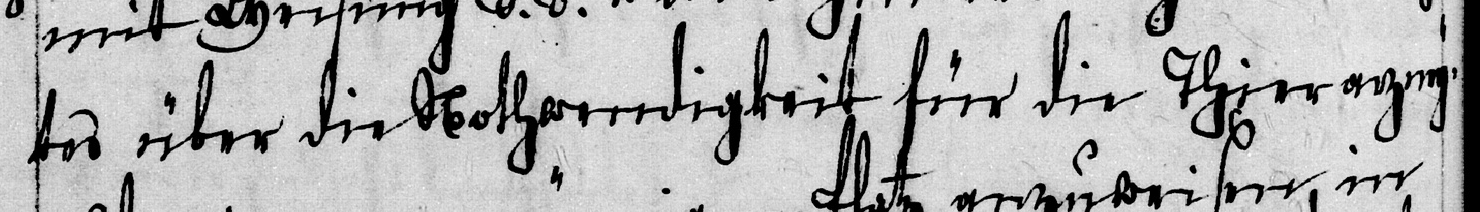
htes über die Nothwendigkeit für die Thierarzne¬
